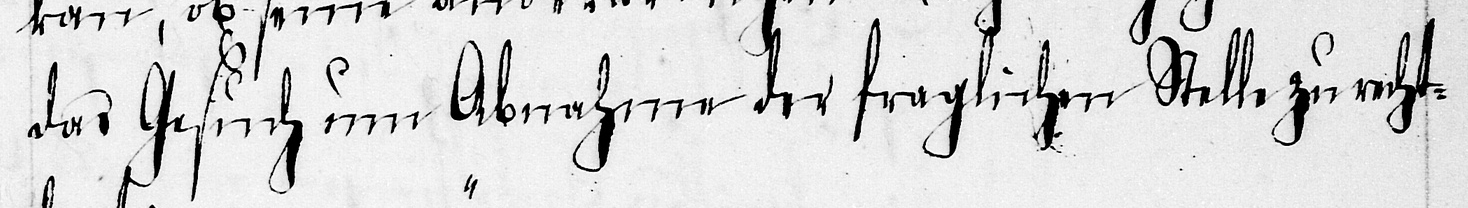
das Gesuch um Abnahme der fraglichen Stelle zu rech¬
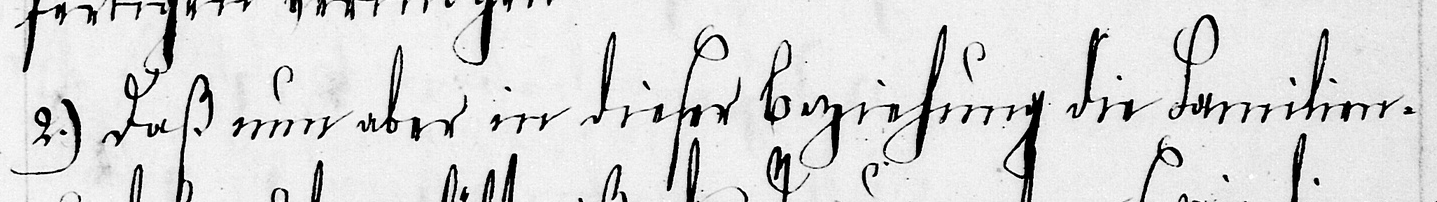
2.) Daß nun aber in dieser Beziehung die Familien-
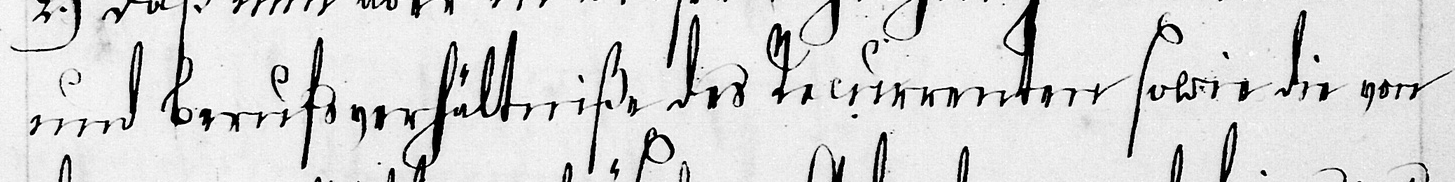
und Berufsverhältniße des Recurrenten sowie die von
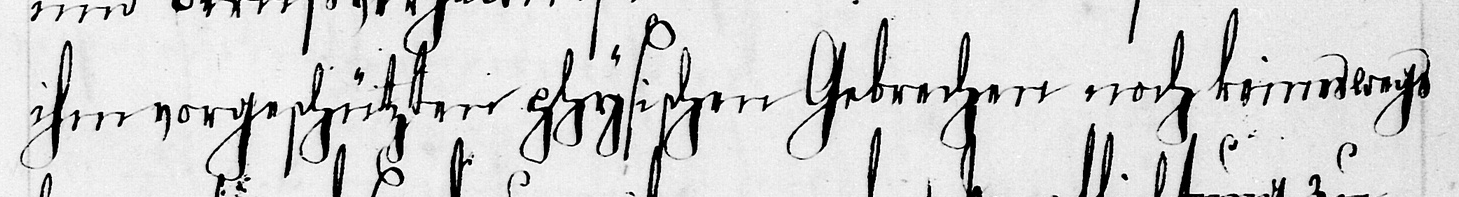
ihm vorgeschützten physischen Gebrechen noch keineswegs
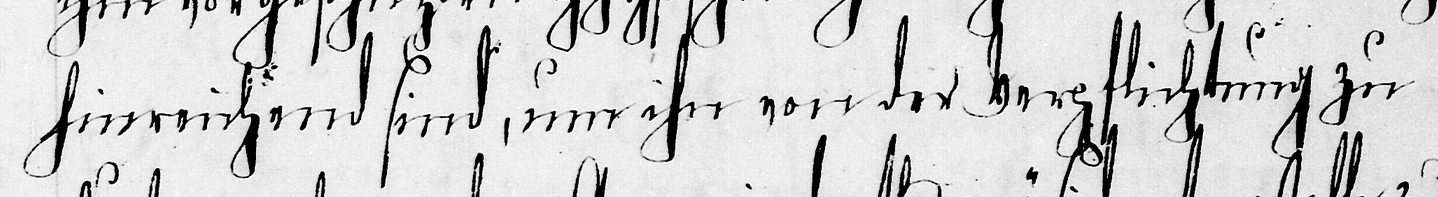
hinreichend sind, um ihn von der Verpflichtung zu
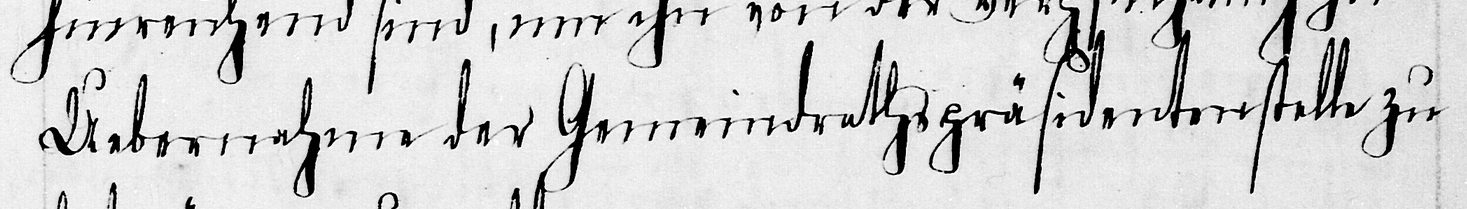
Uebernahme der Gemeindrathspräsidentenstelle zu
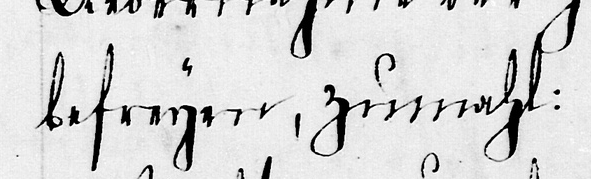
befreyen, zumahl:
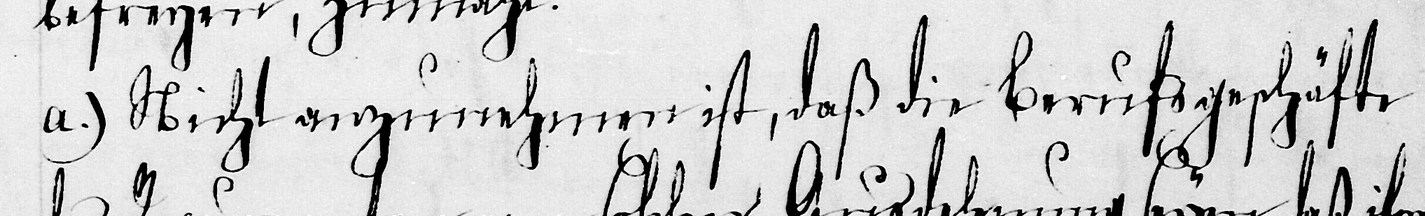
a.) Nicht anzunehmen ist, daß die Berufsgeschäfte
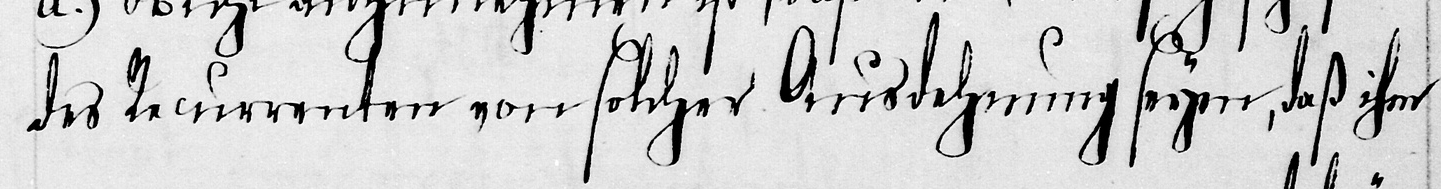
des Recurrenten von solcher Ausdehnung seyen, daß ihm
